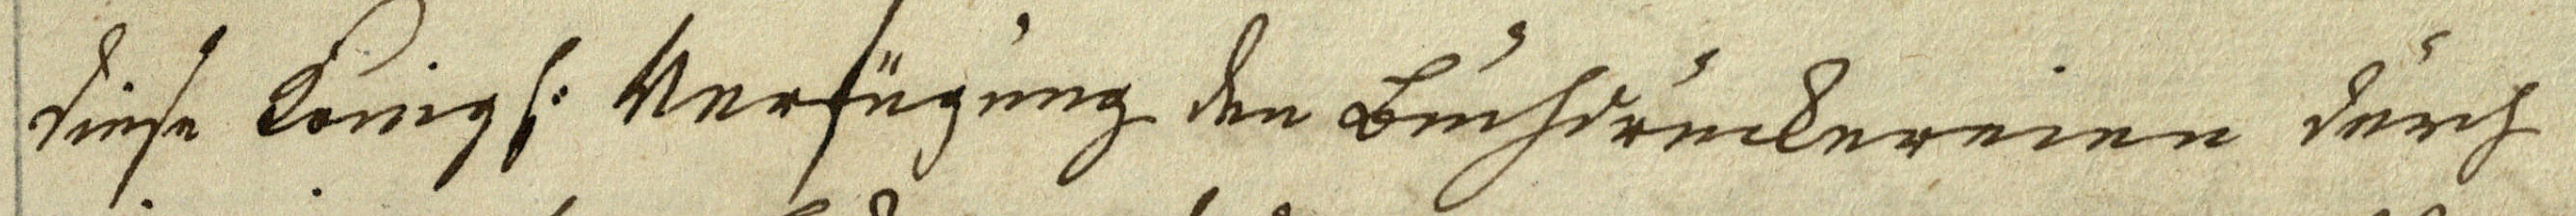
diese Königl. Verfügung den Buchdruckereien durch
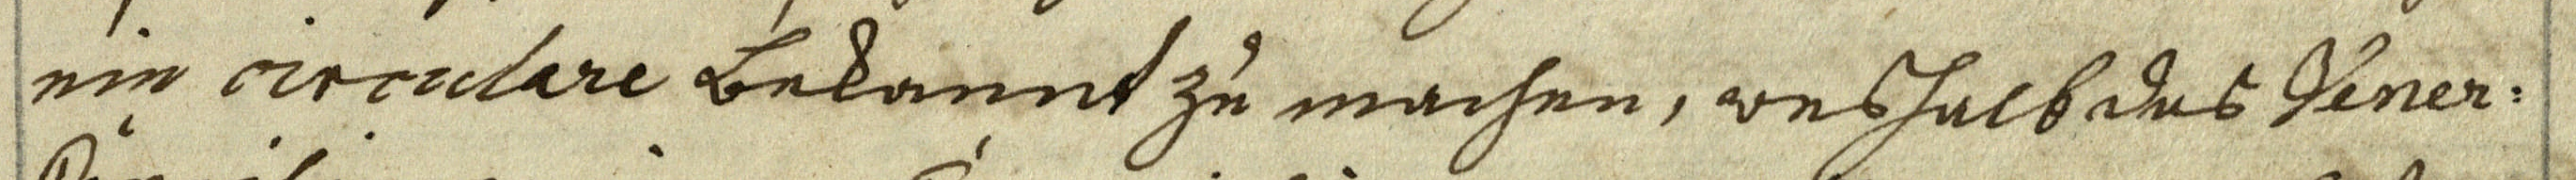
ein circulare bekannt zu machen, weshalb das Vener.
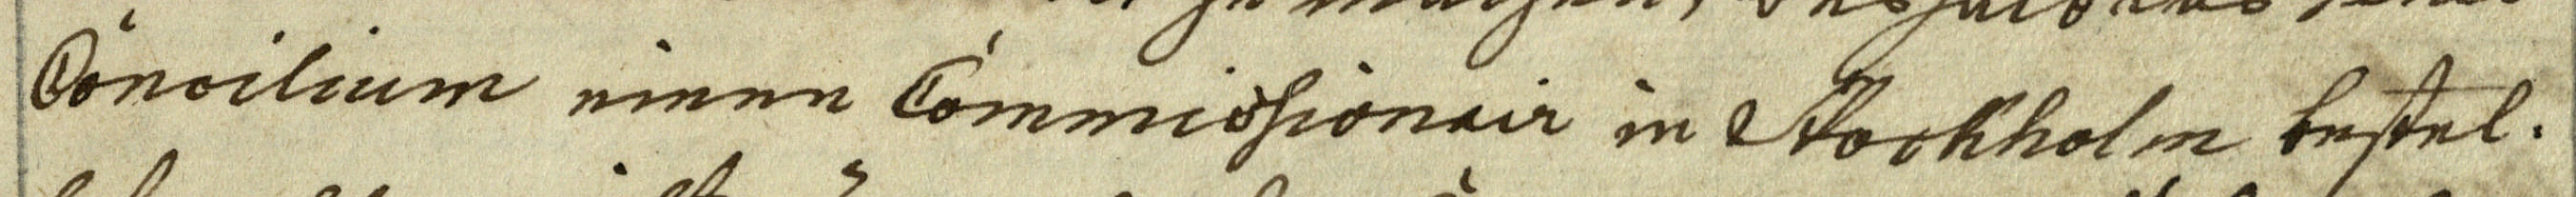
Concilium einen Commissionair in Stockholm bestel¬
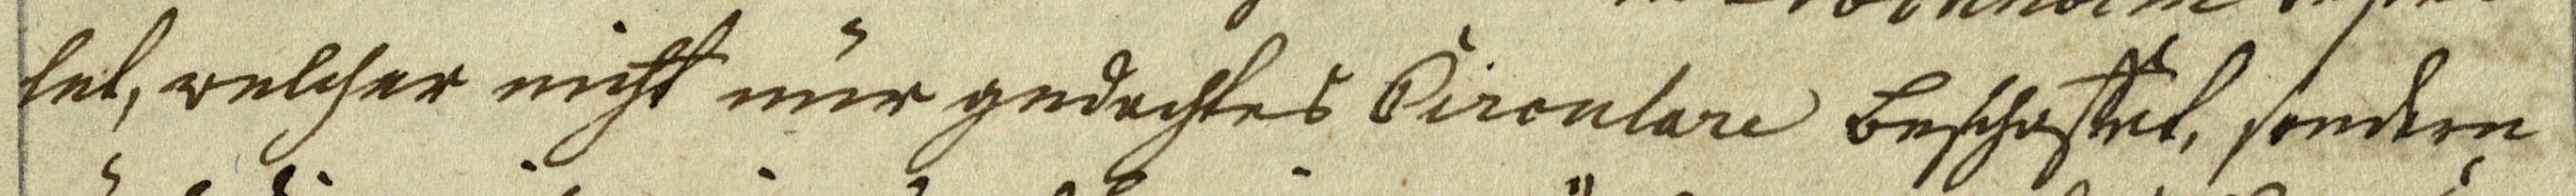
let, welcher nicht nur gedachtes Circular beschaffet, sondern
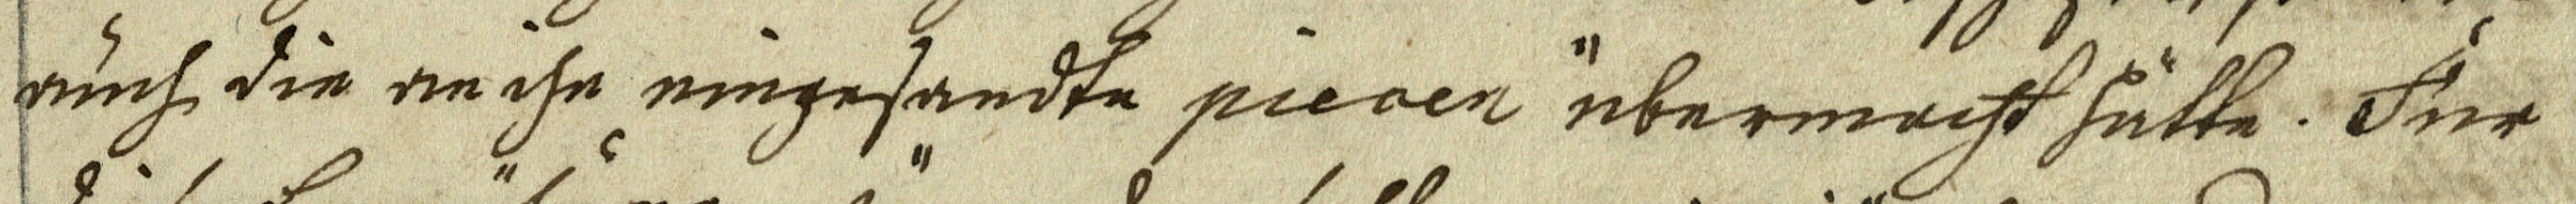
auch die an ihn eingesandte piecen übermacht hätte. Für
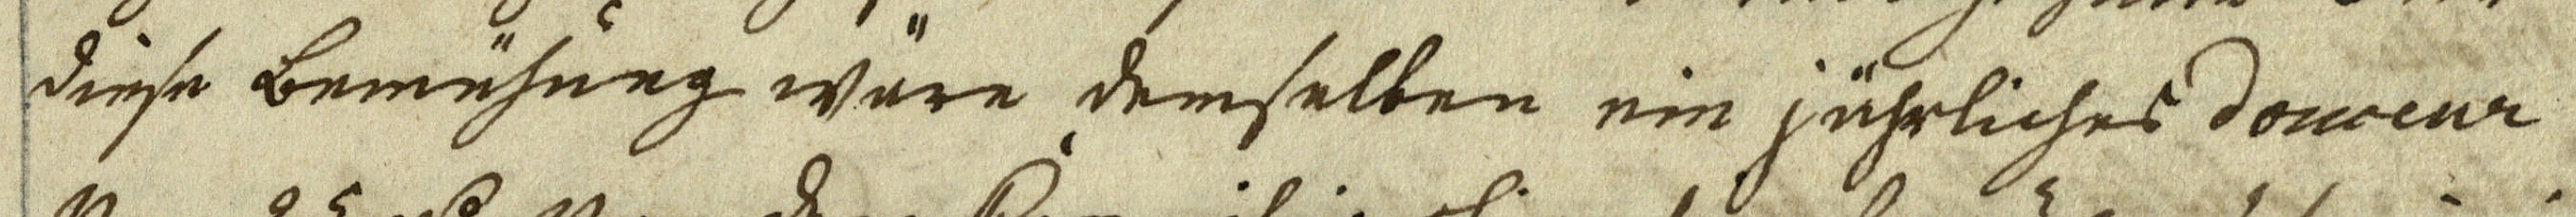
diese Bemühung wäre demselben ein jährliches douceur
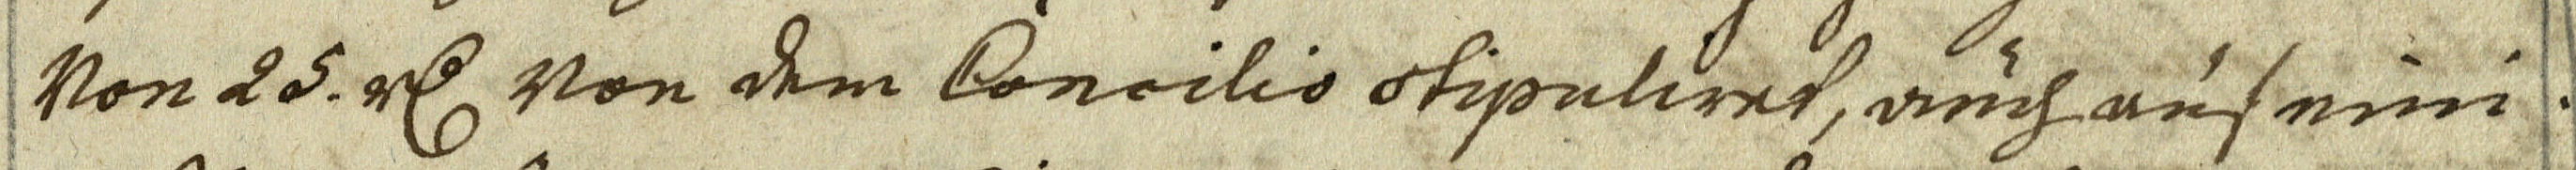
von 25 r. von dem Concilio stipuliret, auch auf eini¬
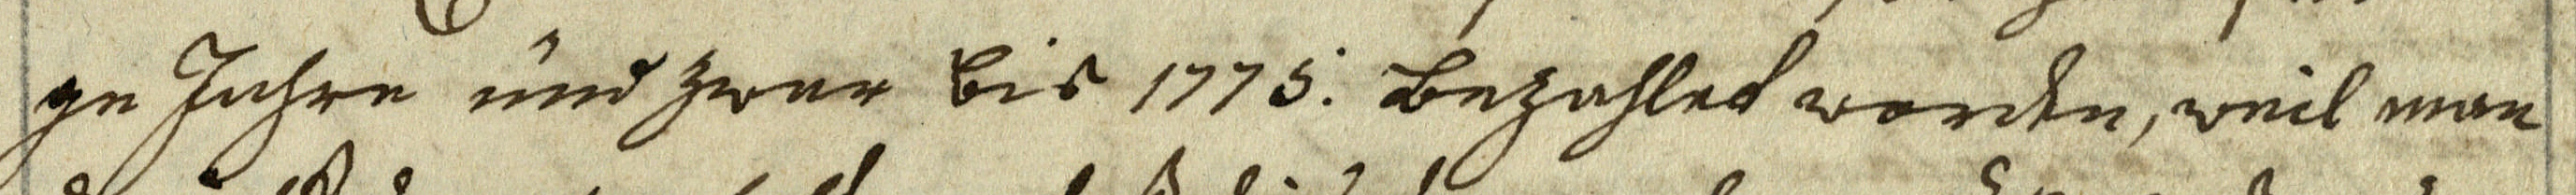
ge Jahre und zwar bis 1775. bezahlet worden, weil man
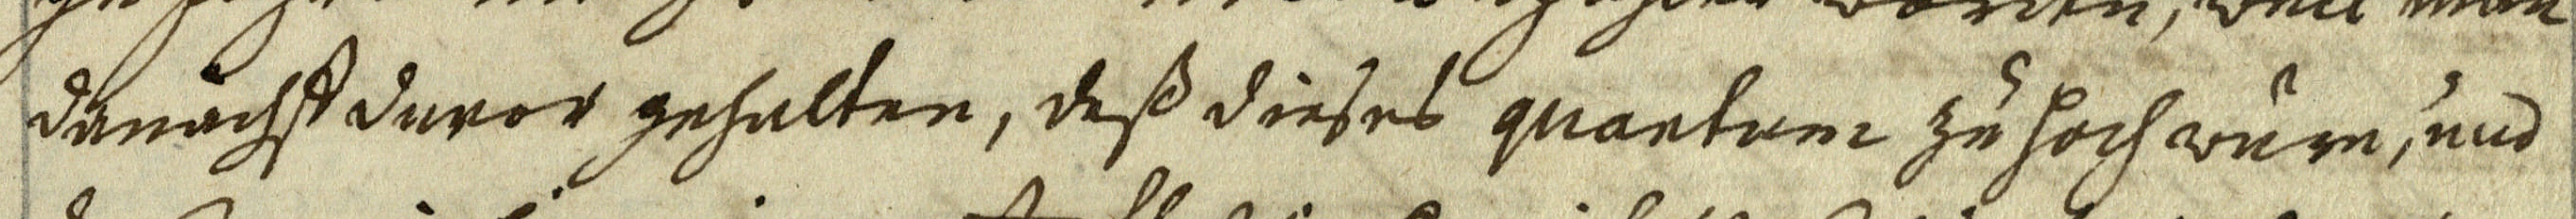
danächst davor gehalten, daß dieses quantum zu hoch wäre, und
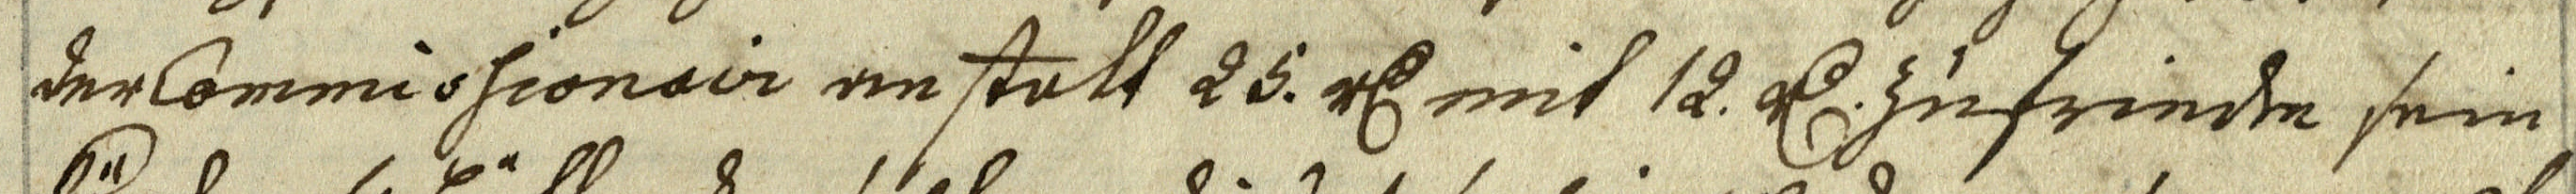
der Commissionair anstatt 25 r. mit 12. r. zufrieden sein
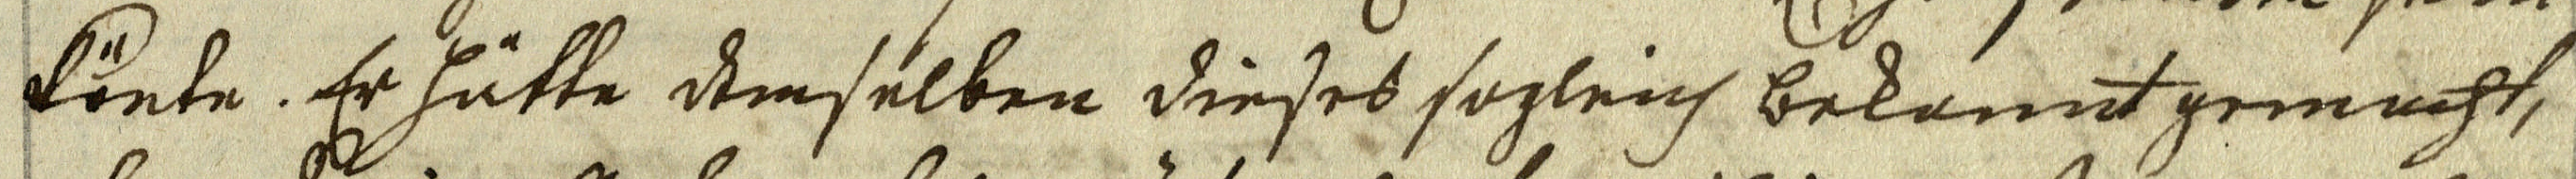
könte. Er hätte demselben diese sogleich bekannt gemacht,
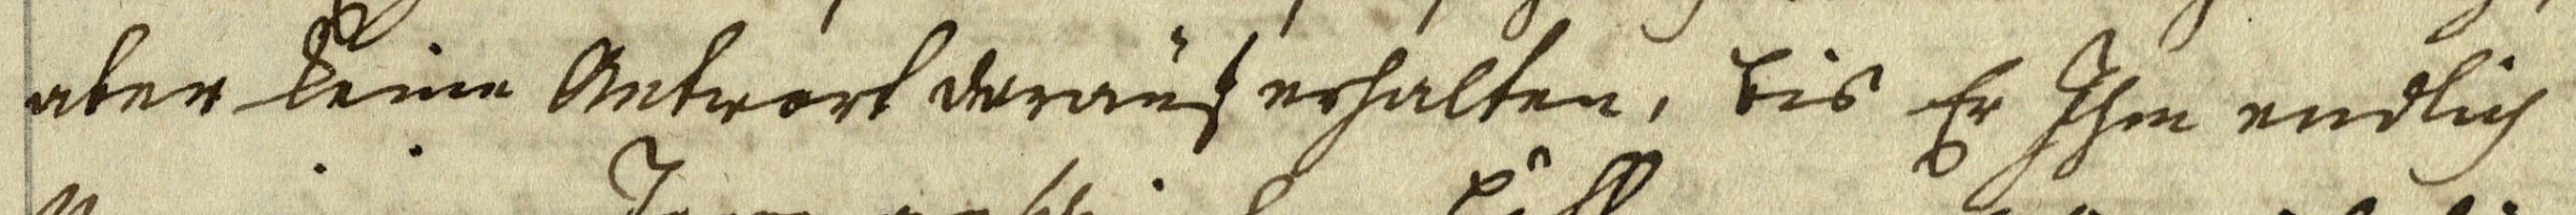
aber keine Antwort darauf erhalten, bis Er Ihm endlich
